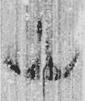山
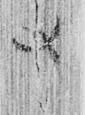又（有）
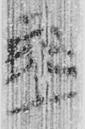堋（崩）
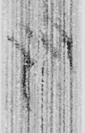川
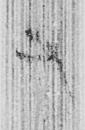又（有）
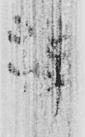滐（竭）
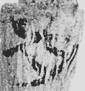日月
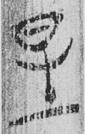星
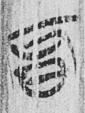晨
